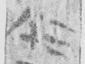八十=
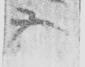九
